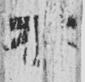而
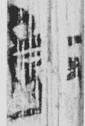○（墼）
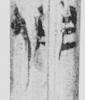○（文）
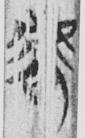○（乎）
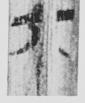亓（其）
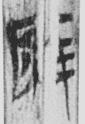雁（膺）
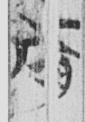前（延）
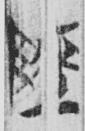陵
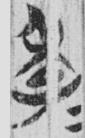季子
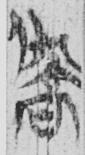僑
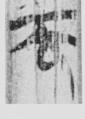而
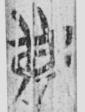弗
